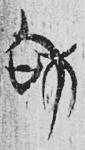和
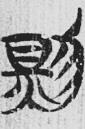則
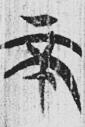不
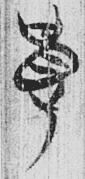○（輯）
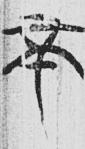不
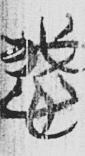{我心}（義）
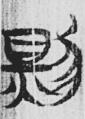則
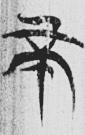不
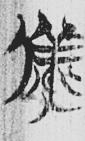備（服）
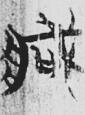戕（莊）
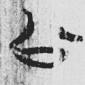公
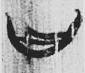曰
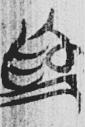爲
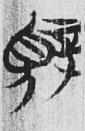親
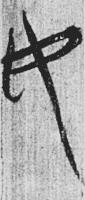女（如）
